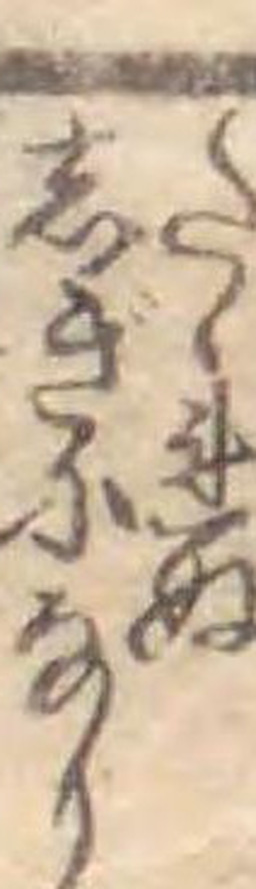しぎになり
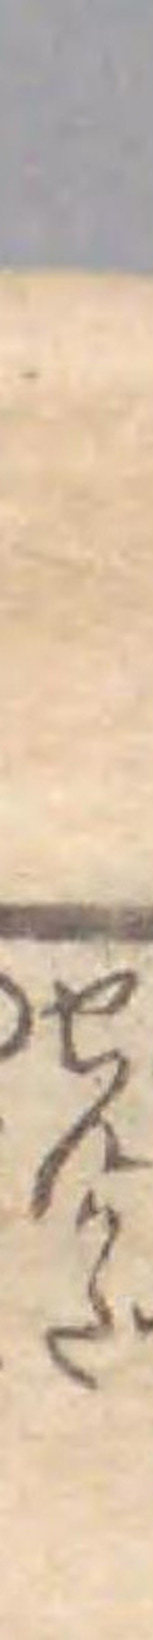せんかた
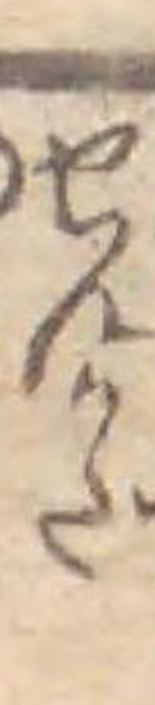せんかた
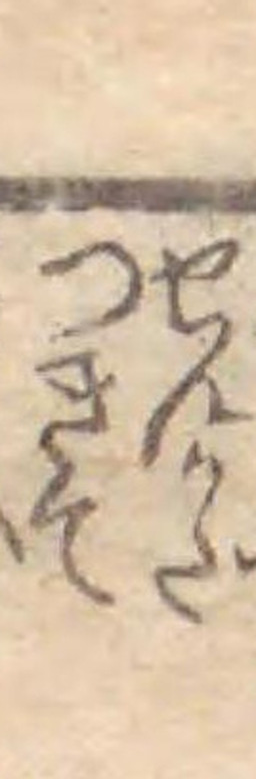つきて
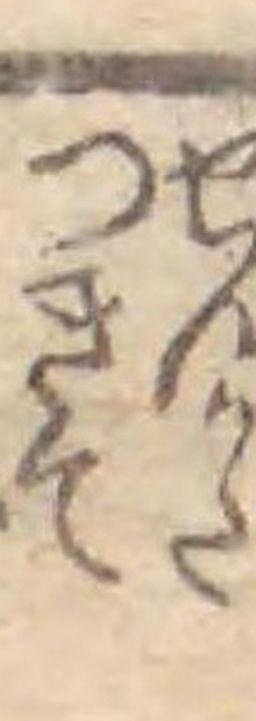つきて
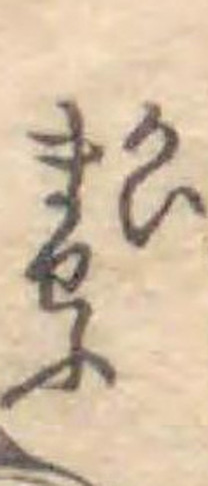ませふ
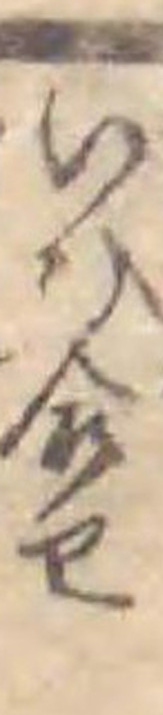いひ合せ
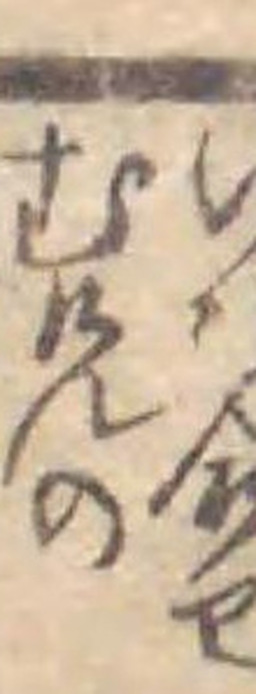むけんの
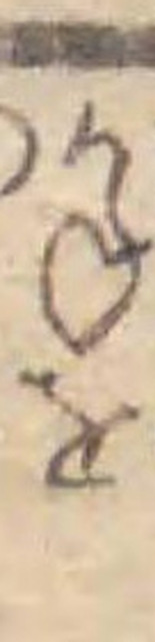かねを
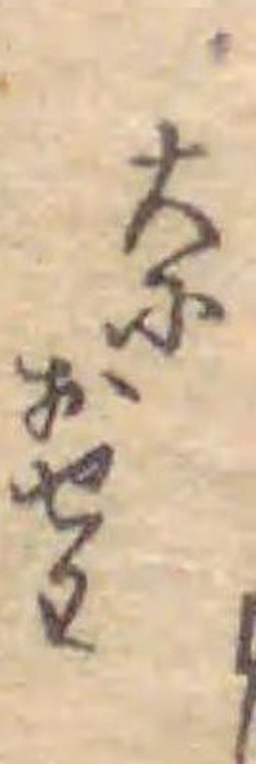おせわ
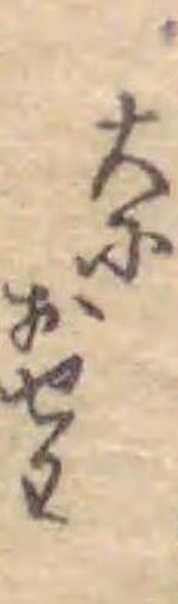おせわ
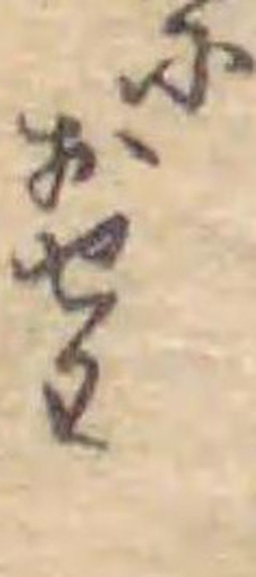おせわ
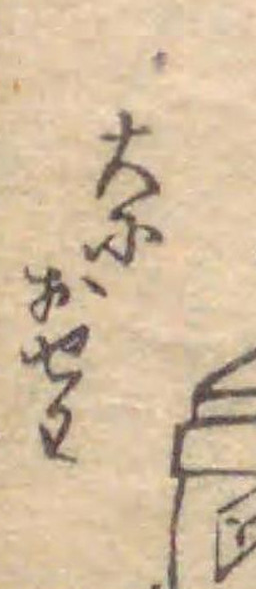おせわ

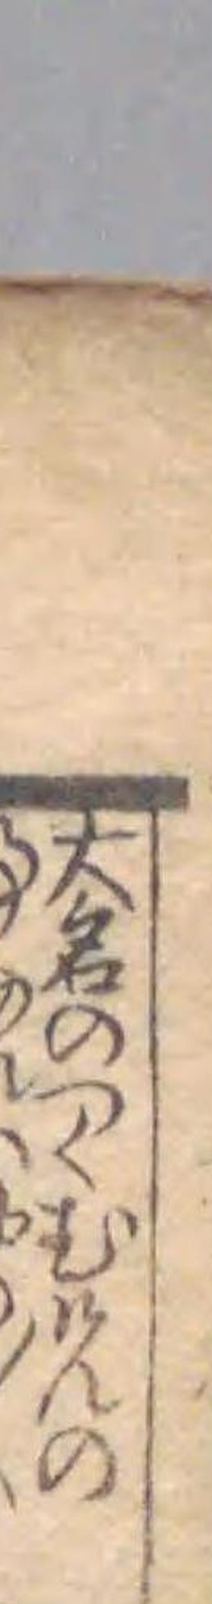大名のつくむけんの
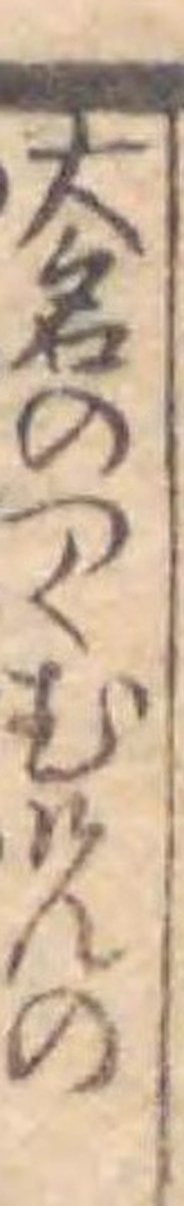大名のつくむけんの
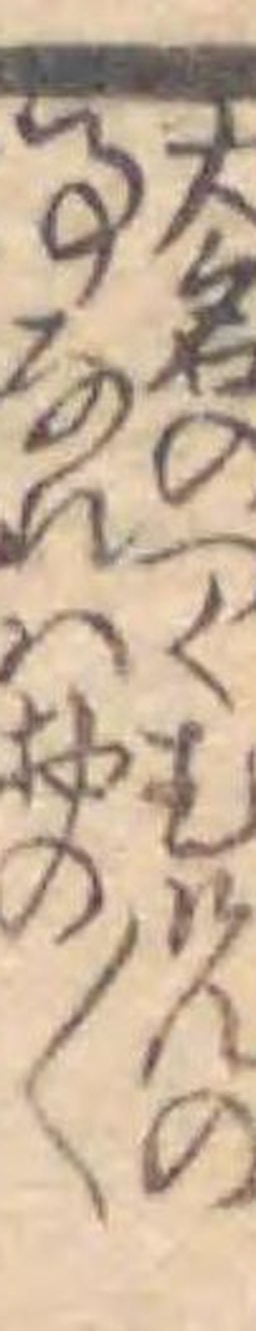事なれはおの〳〵
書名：文武二道万石通 : 3巻
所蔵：国立国会図書館 National Diet Library, JAPAN
